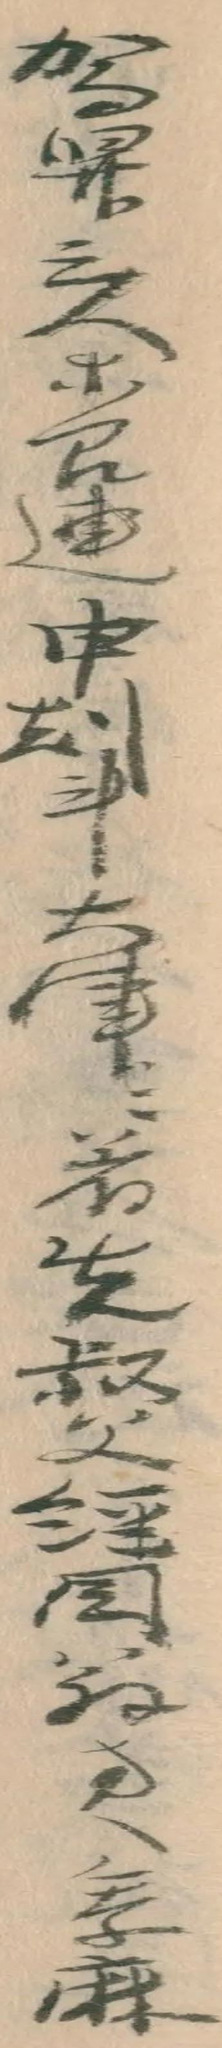駕舁三人等召連申刻斗大津ニ着先叔父経岡翁方へ参麻
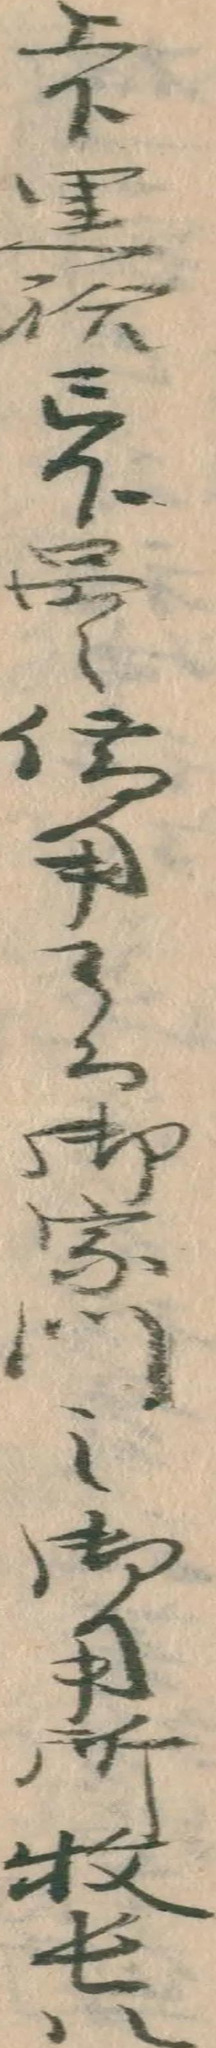上下黒袷已下品々借用了而御家門之御用所牧長八
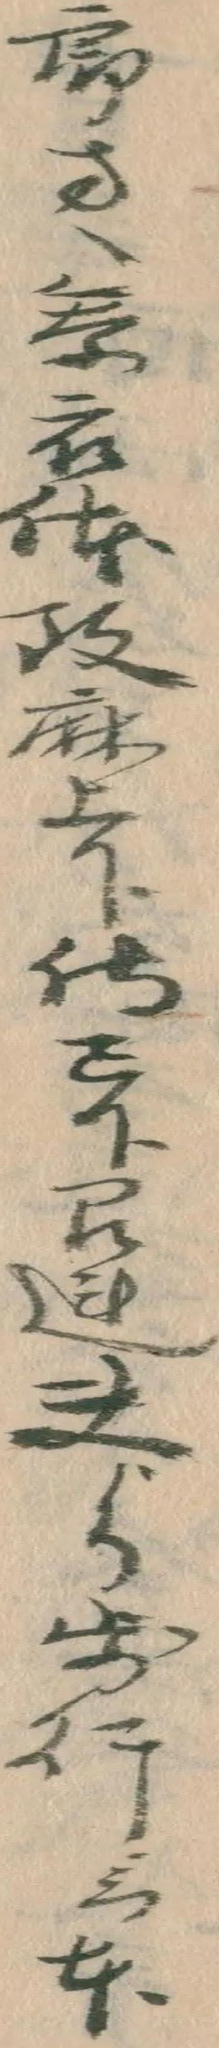郎方へ参衣体改麻上下侍已下召連夫より歩行ニ而本
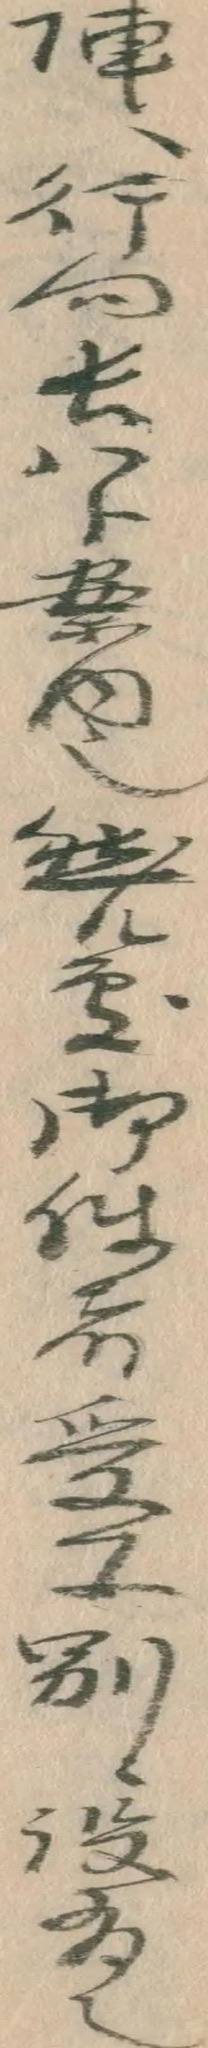陣へ行向長八郎案内也然ル處御使者受所別候設有之
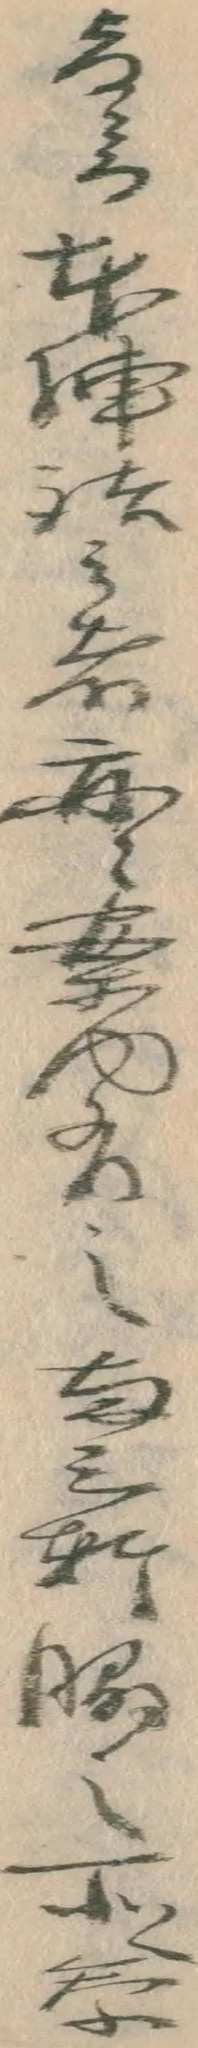旨ニ而本陣詰之者亦々案内有之両三軒脇之所へ参
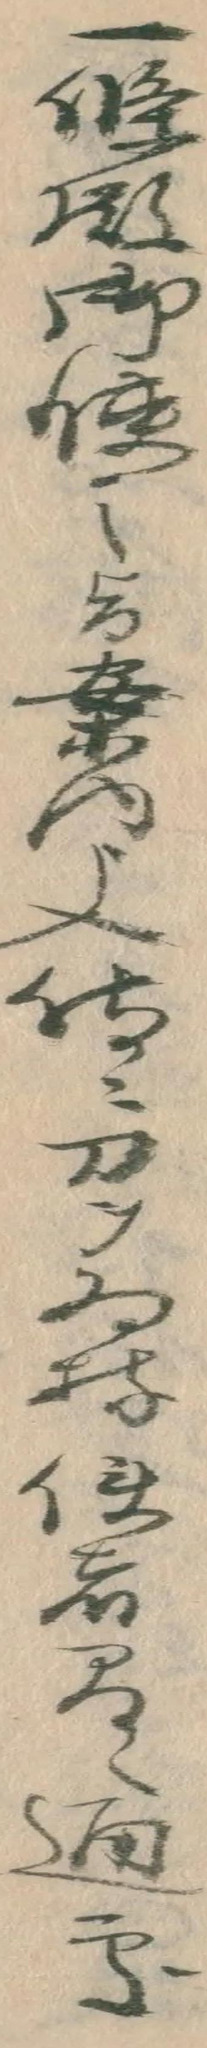一條殿御使之旨案内申入侍ニ刀ヲ為持使者間へ通處
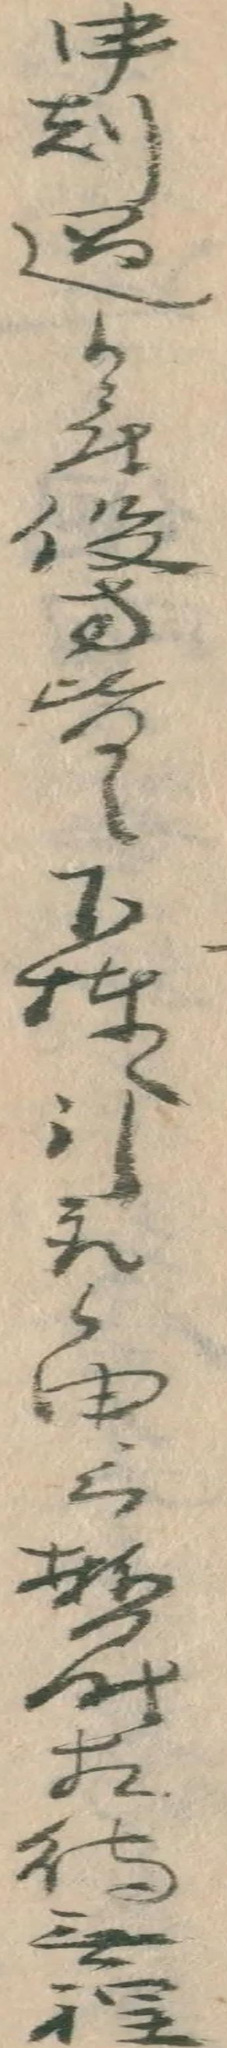申刻過候ニ付役方皆々下棟へ引取候由ニ而暫時相待無程
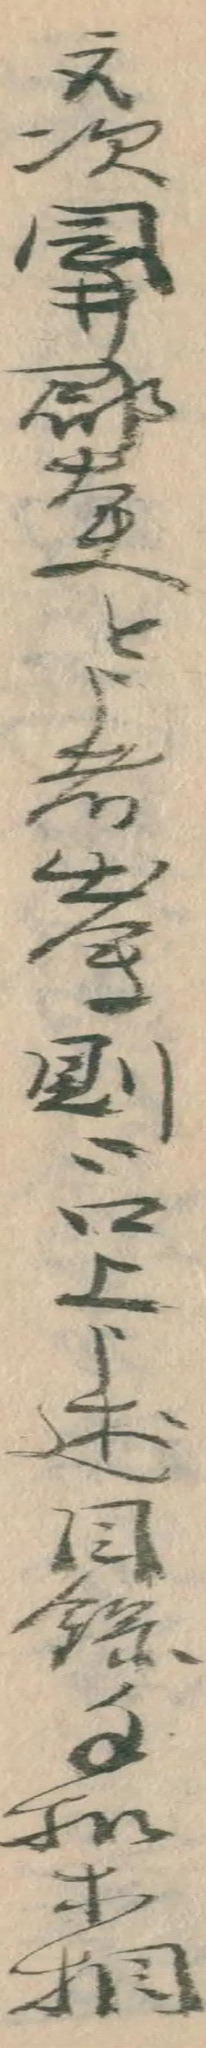取次岡井郡大夫と申者出會則御口上申述目録手扣等相
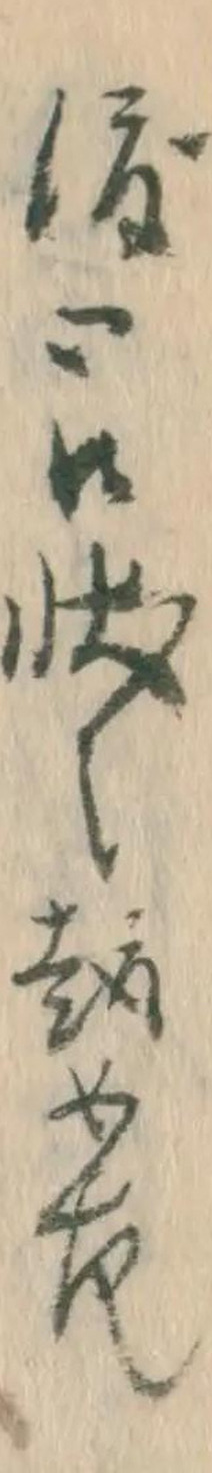渡候御状趣如左
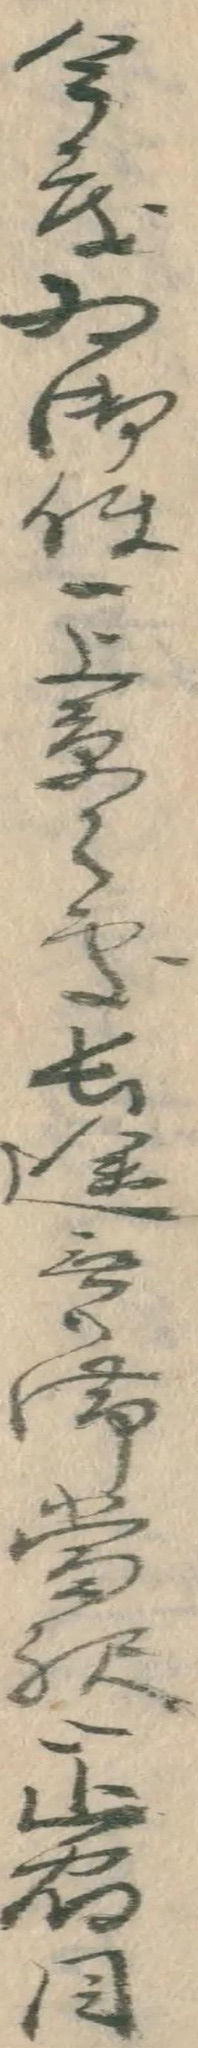今度為御使上京之處長途無御滞當駅御止宿目
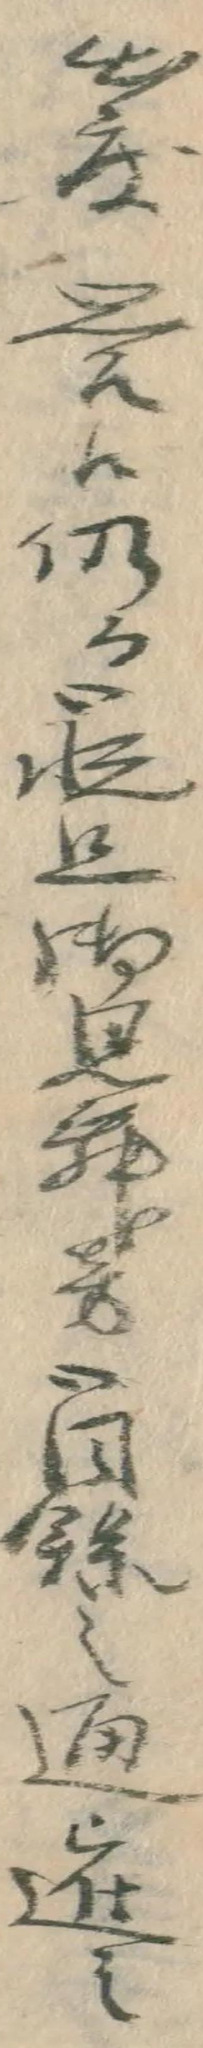出度思召候仍而御悦且御見舞旁御目録之通被進之
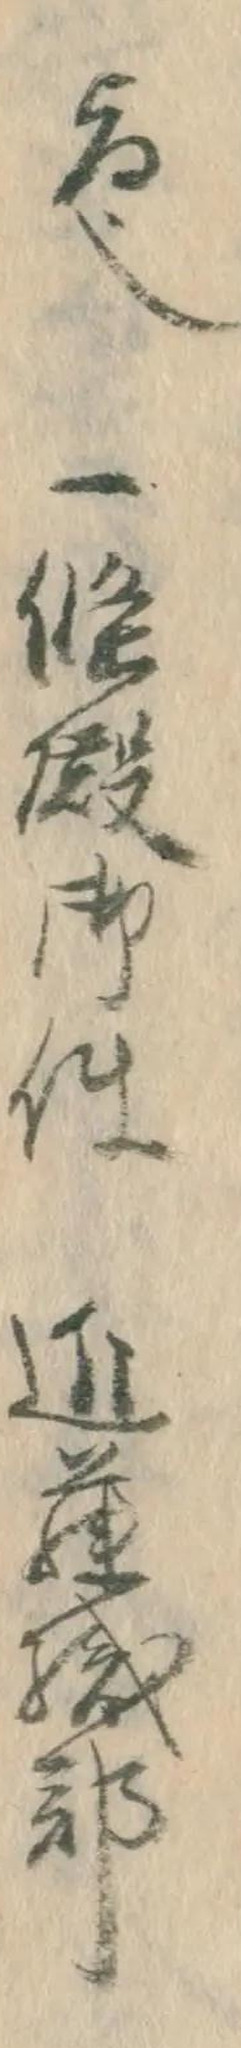旨也一条殿御使近藤織部

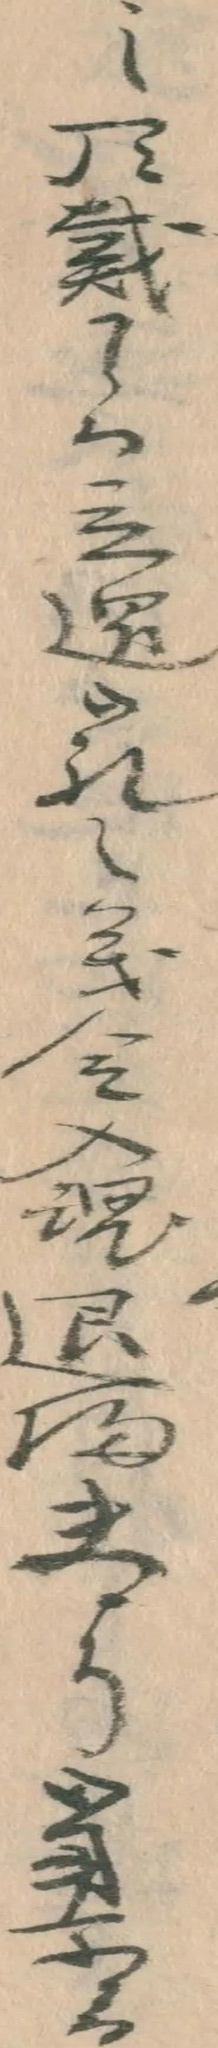之頂戴了而立退御礼之義令入魂退帰夫より御用所ニ而
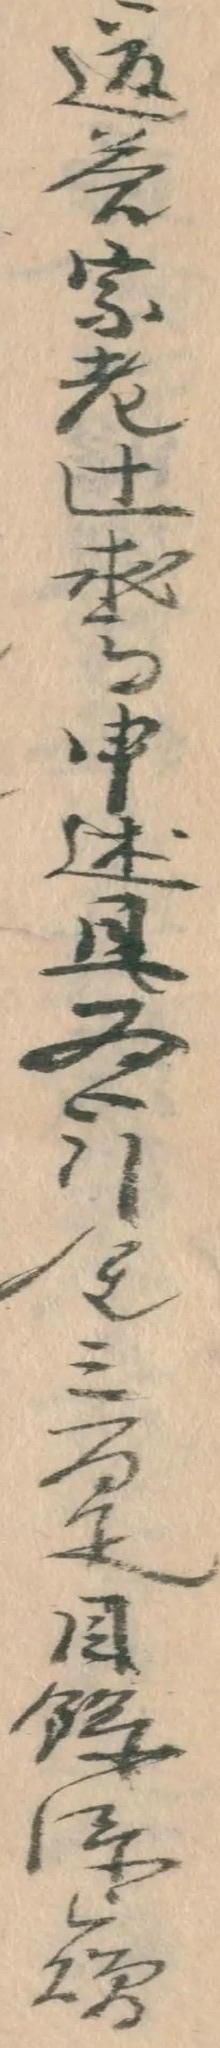ハ返答家老辻求馬申述且為御引金三百疋目録添被贈
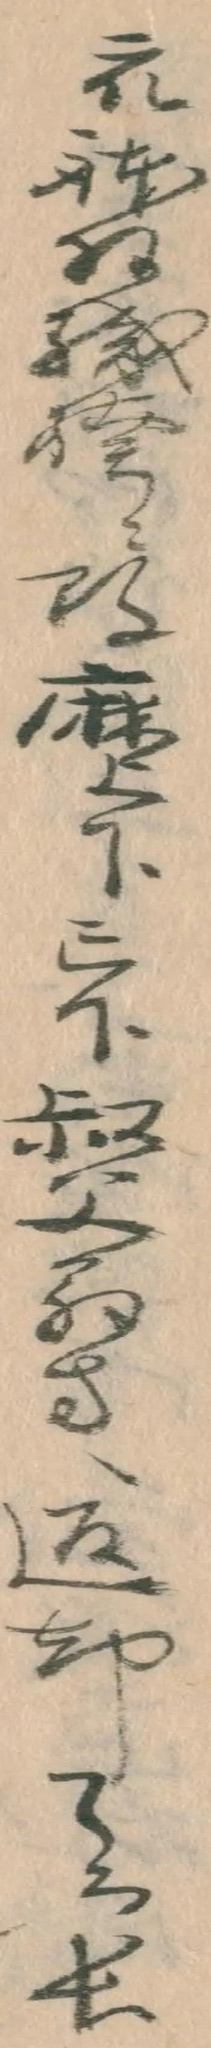衣躰羽織ニ改麻上下已下叔父翁方へ返却了而長
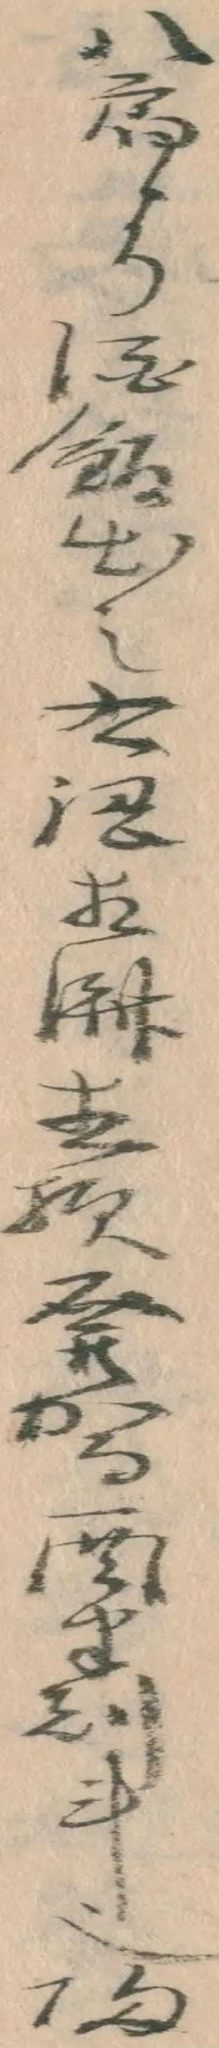八郎より酒飯出之右認相済直様発駕酉半刻斗也帰
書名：賀茂社記録. 第63冊
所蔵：国立国会図書館 National Diet Library, JAPAN
